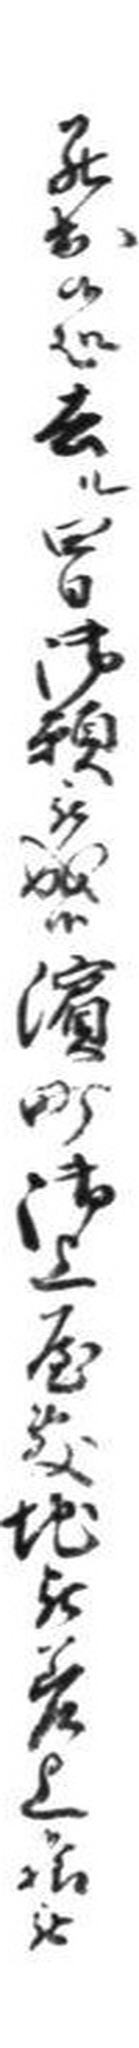罷出候処去ル四日御願被成候浜町御上屋敷地被差上候様被
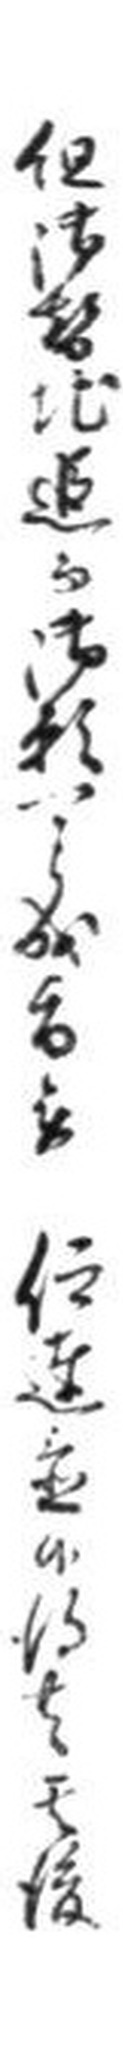但御替地追而御願可被成旨被仰達置候得者其後
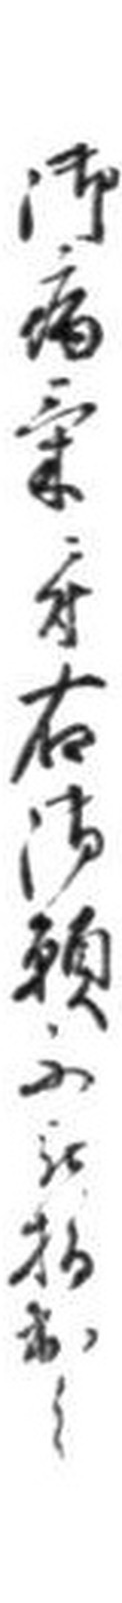御病気ニ付右御願不被指出之
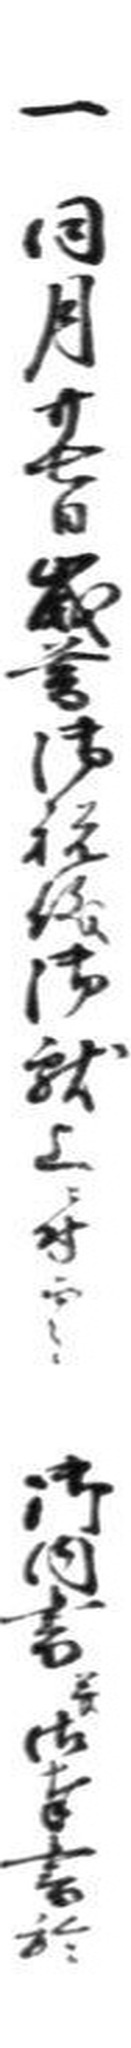一同月廿七日歳暮御祝儀御献上ニ付而之御内書并御奉書於
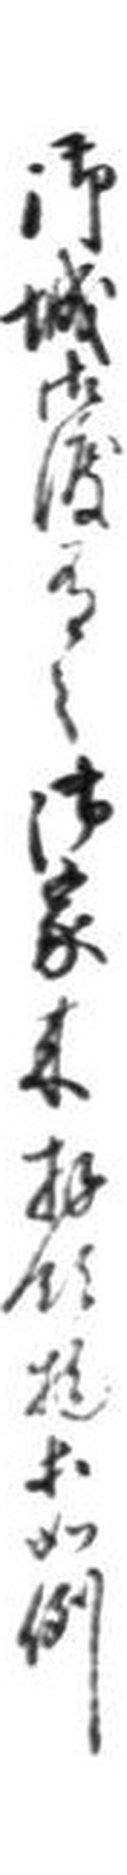御城御渡有之御家来拝領物等如例
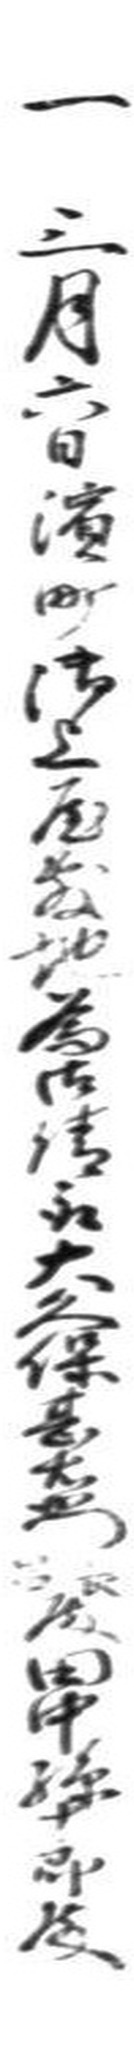一三月六日浜町御上屋敷地為御請取大久保甚右衛門長殿田中孫十郎殿
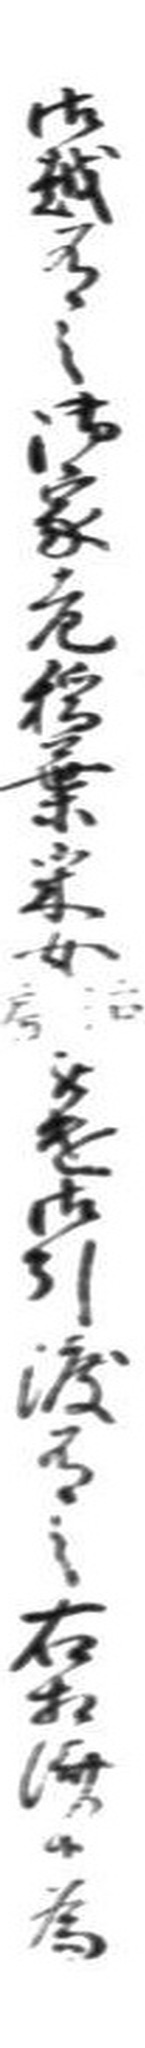御越有之御家老稲葉采女治房被遣御引渡有之右相済候為
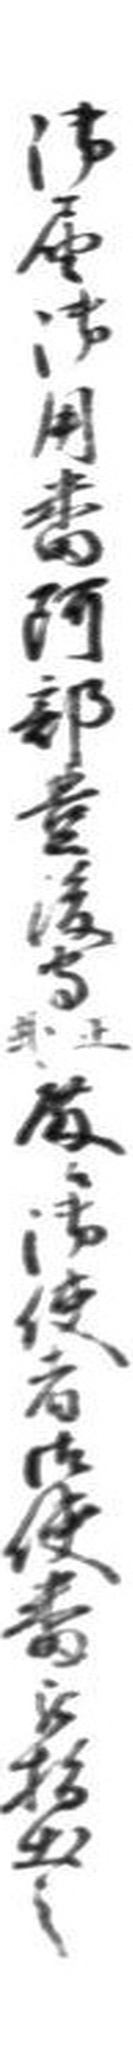御届御用番阿部豊後守正武殿江御使者御使番被指出之
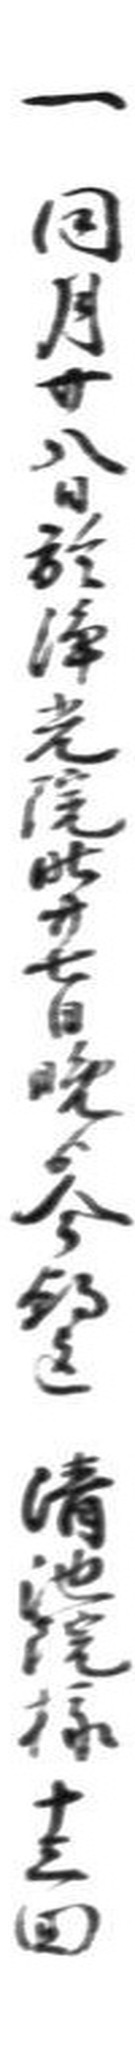一同月廿八日於浄光院昨廿七日晩ゟ今朝迄清池院十三回
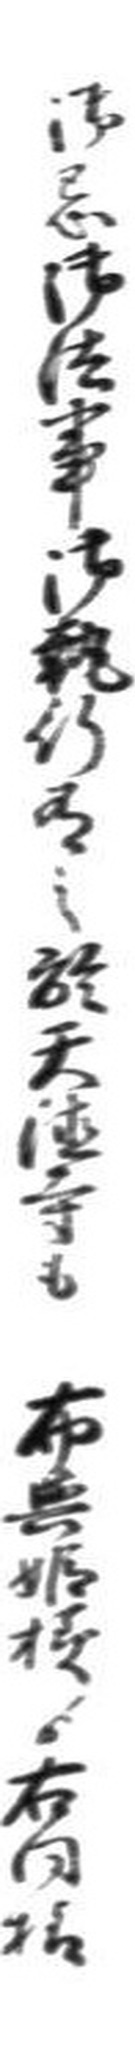御忌御法事御執行有之於天徳寺も布与姫様ゟ右同様
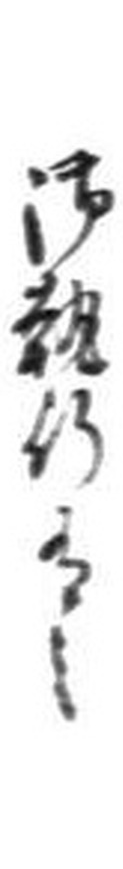御執行有之
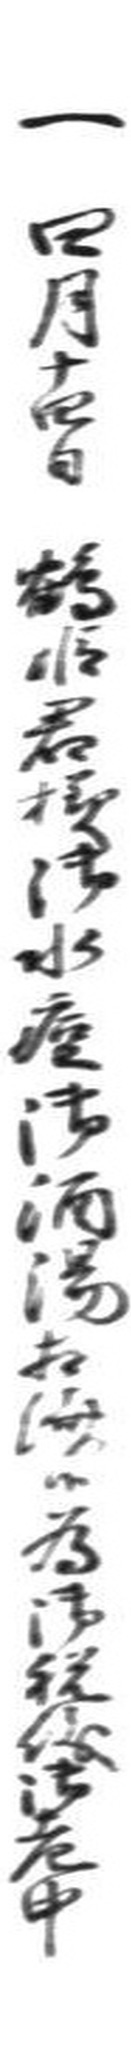一四月十四日鶴姫君様御水痘御酒湯相済候為御祝儀御老中
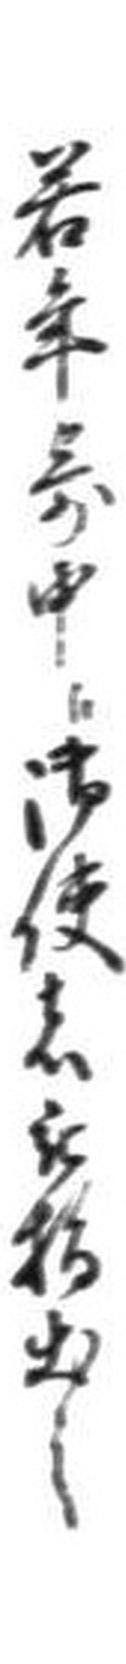若年寄中江御使者被指出之

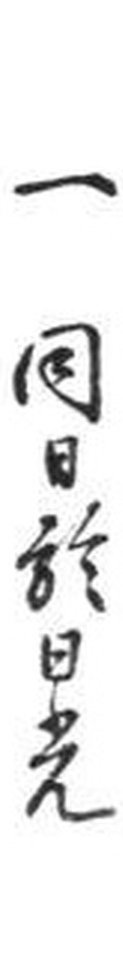一同日於日光
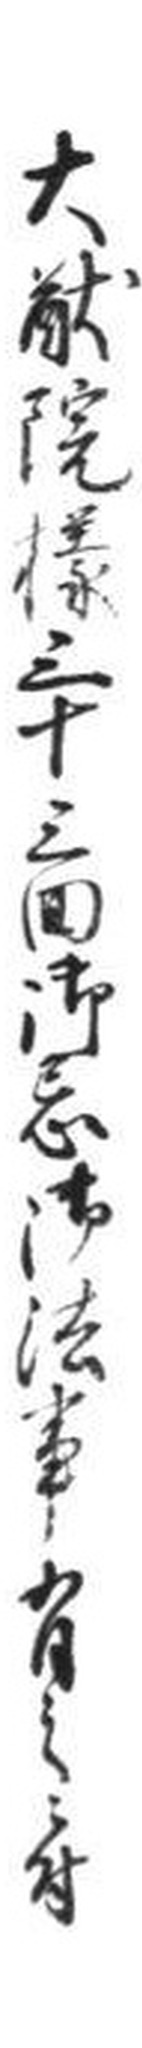大猷院様三十三回御忌御法事有之ニ付
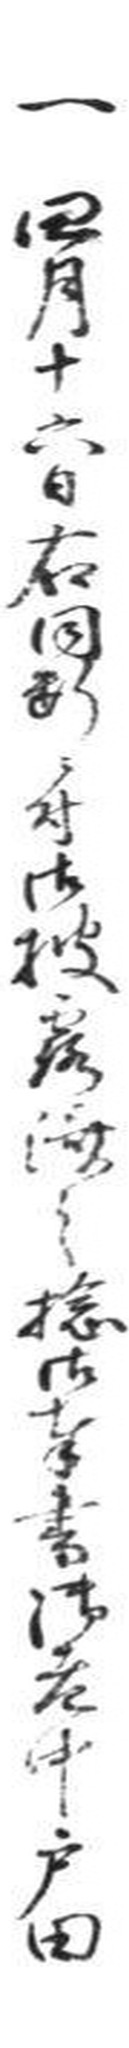一四月十六日右同断ニ付御披露済之捻御奉書御老中戸田
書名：家譜 十五 綱昌公 従天和元年到元禄十二年
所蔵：福井県文書館 Fukui Prefectural Archives
